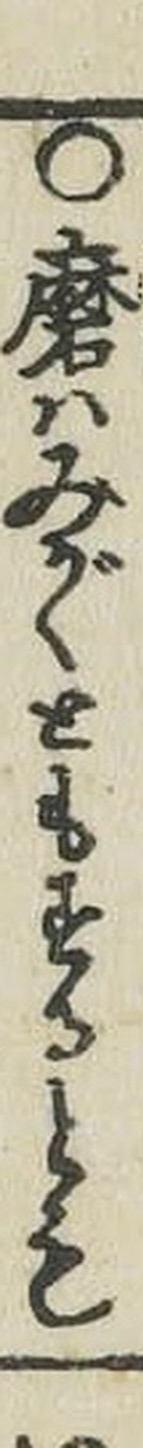○磨はみがくともするとも
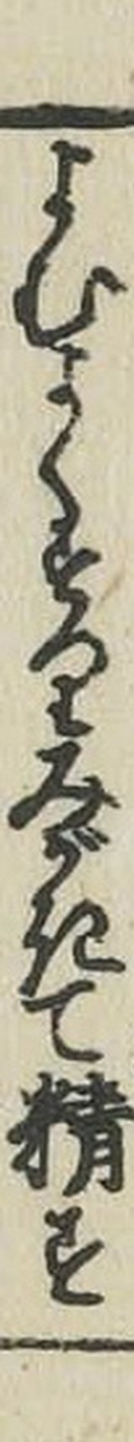よむよくすりみがきて精す

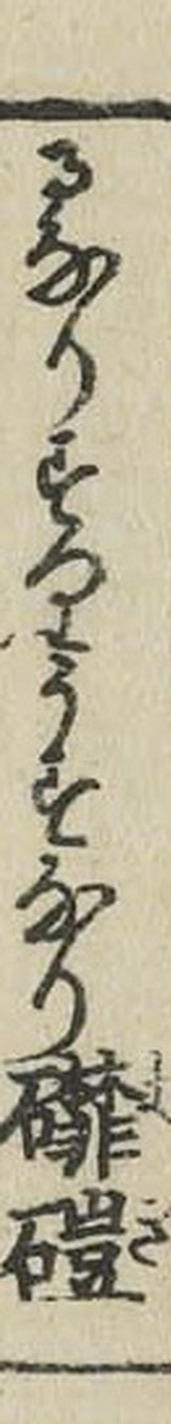るなりすりうすなり？磑
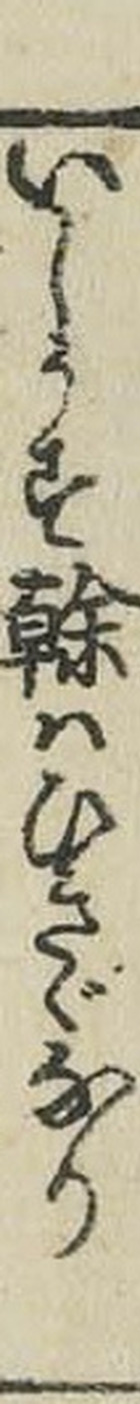いしうす幹はひきゞなり
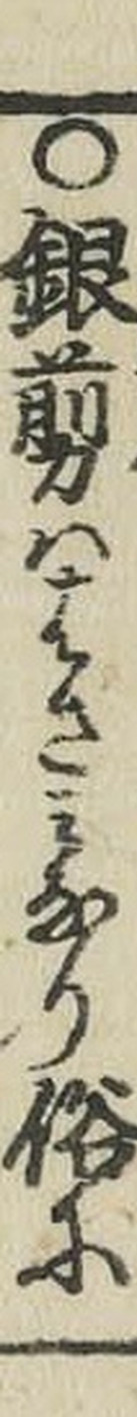○銀剪ははさみなり俗に
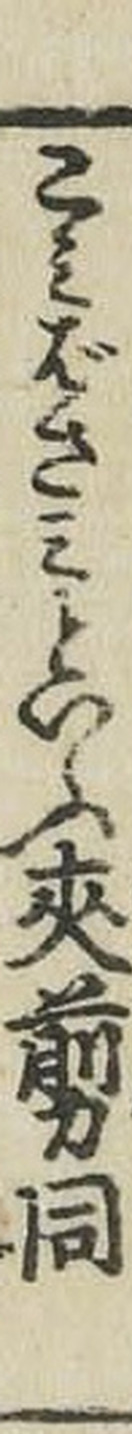こみばさみといふ夾剪同
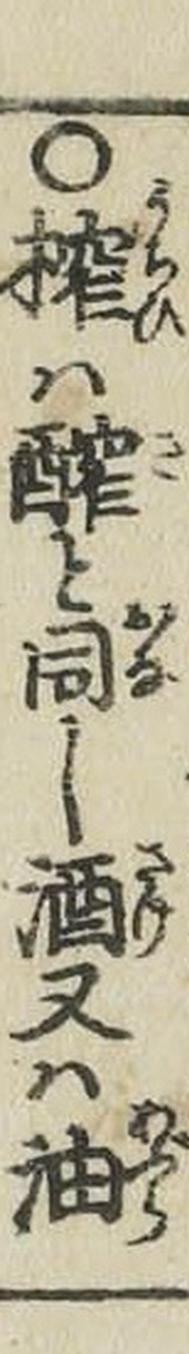○榨は醡と同し酒又は油
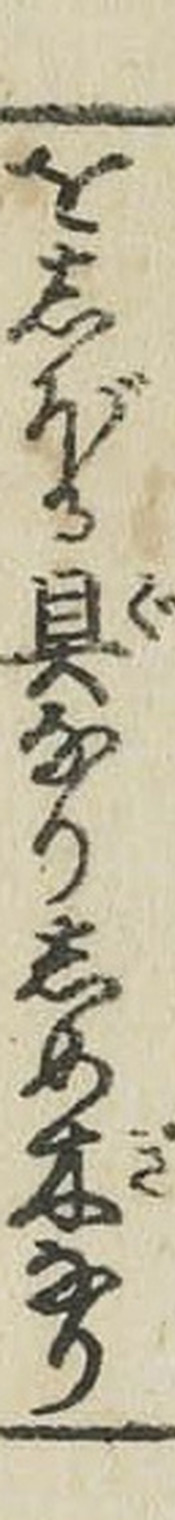をしぼる具なりしめ木なり
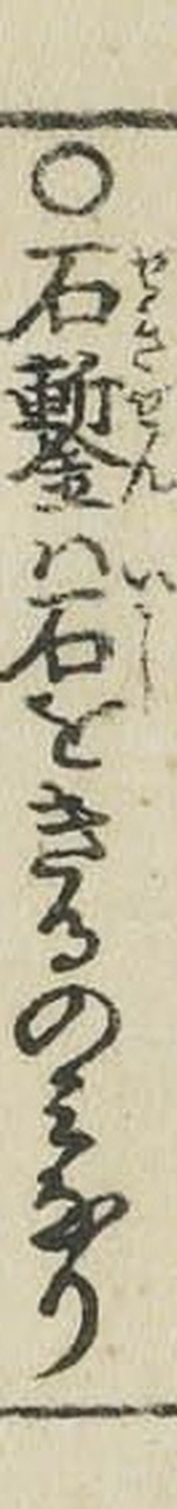○石鏨は石をきるのみなり
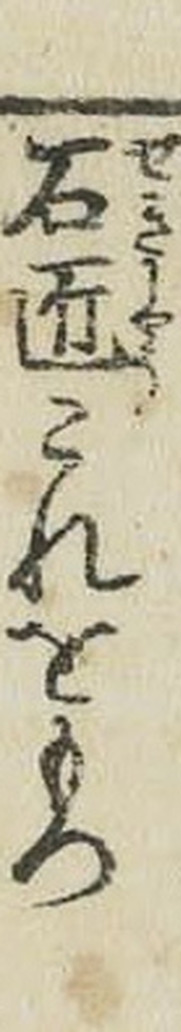石匠これをもつ
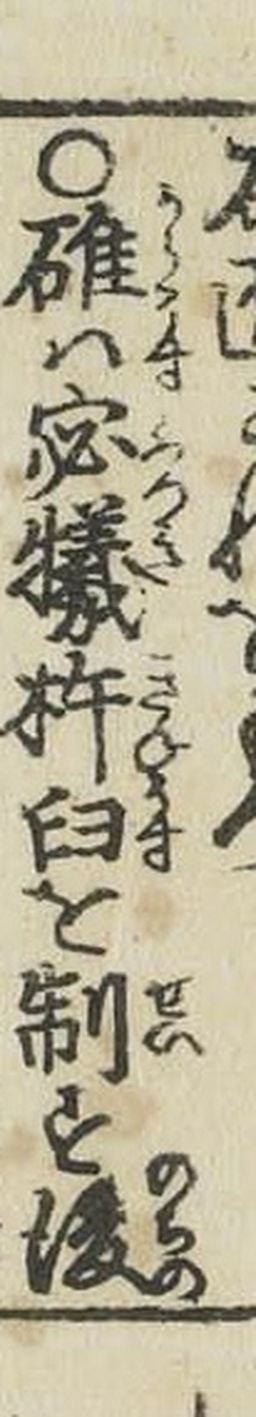○碓は宓犠杵臼を制す後
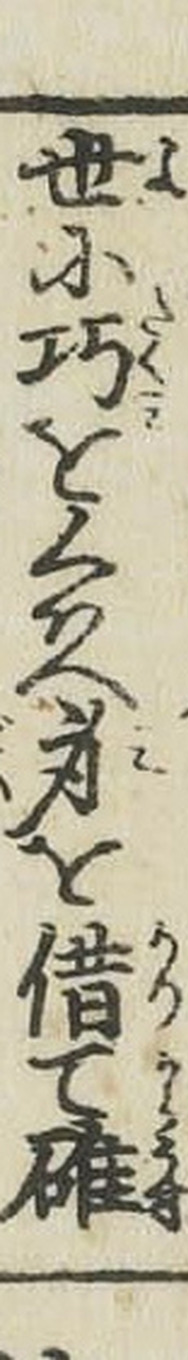世に巧をくはへ身を借て碓
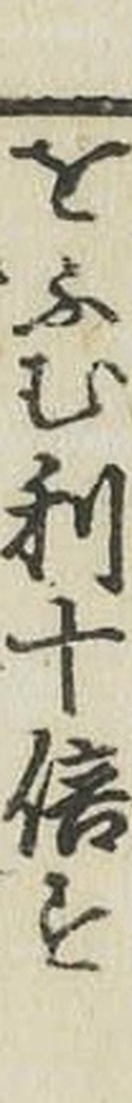をふむ利十倍す
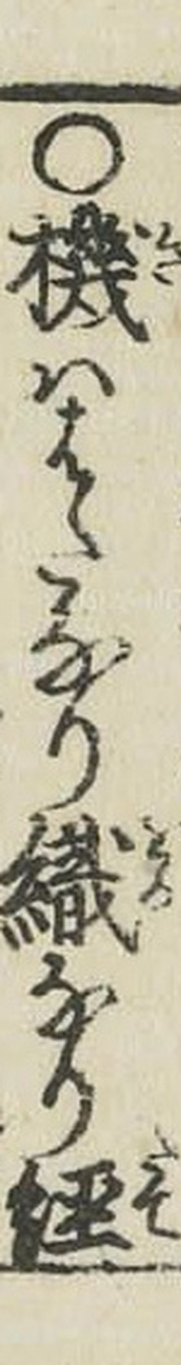○機ははたなり織なり経
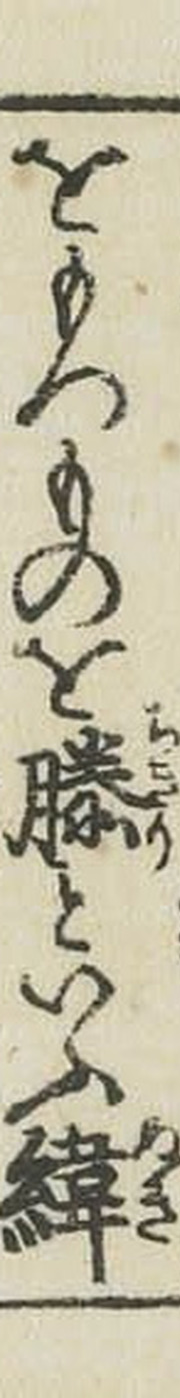をもつものを榺といふ緯
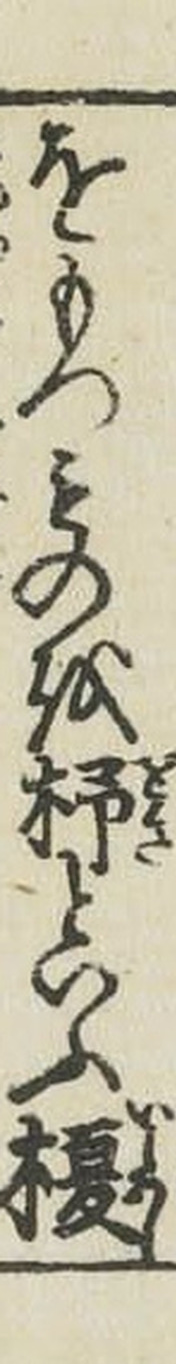をもつものを杼といふ椱
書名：増補頭書訓蒙図彙大成 10巻 5:巻之9-11
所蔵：東京学芸大学教育コンテンツアーカイブ
